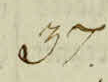37
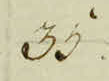35
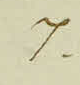7
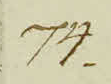74
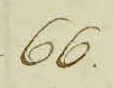66
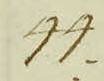44
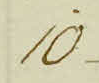10
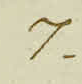7
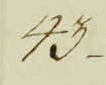43
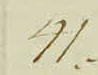41
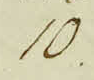10
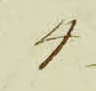4
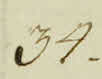34
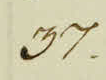37
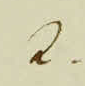2
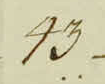43
